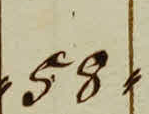58
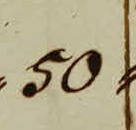50
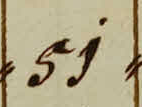51
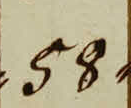58
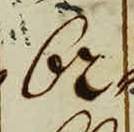62
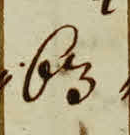63
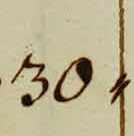30
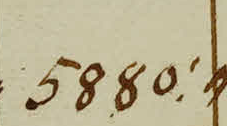5880.
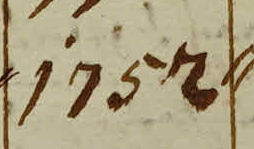1752
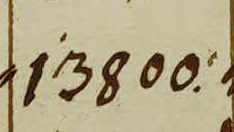13800.
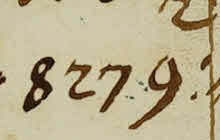8279
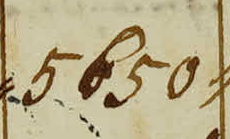5650
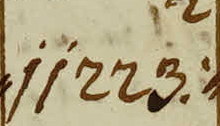11223
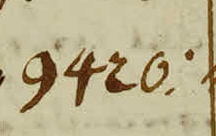9420.
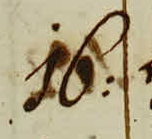16:
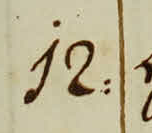12:
